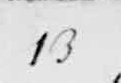13
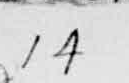14
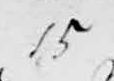15
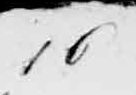16
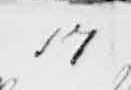17
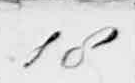18
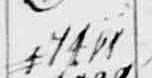47411
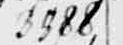3588
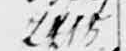2415
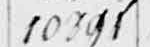10391
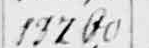13760
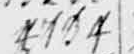4734
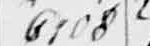6108
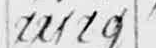22129
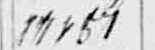17157
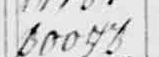30053
